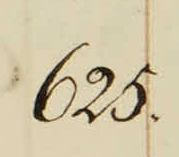625
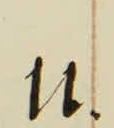11
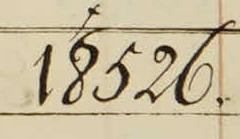18526
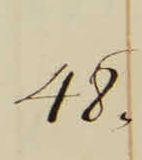48
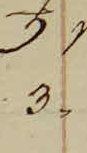3
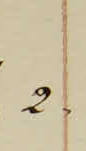2
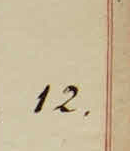12.
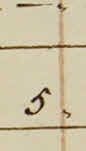5
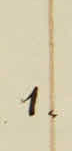1
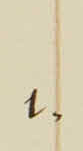1
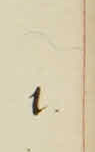1.
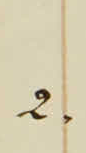2
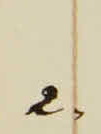2
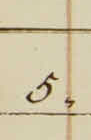5
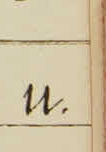11.
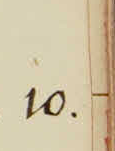10.
